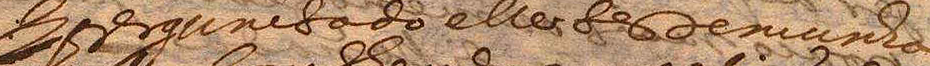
E pergumtado elle testemunha
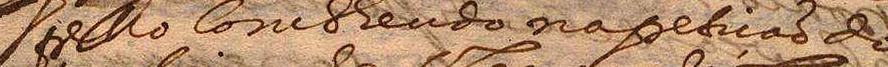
pello Comtheudo na petiçaõ do
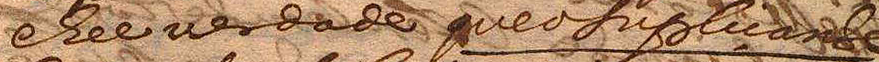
e hee uerdade que o suplicante
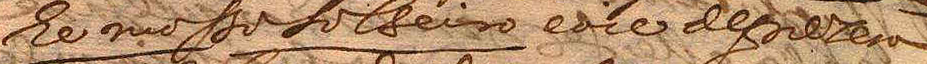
he mosso solteiro e oie de prezem
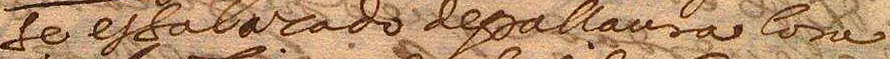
te esta Cazado de pallaura Com
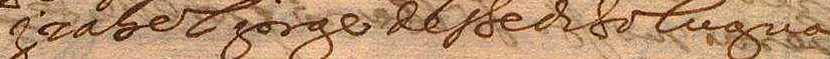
jzabel jorge deste dito luguar
